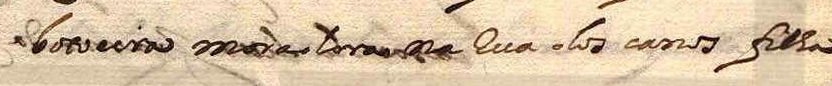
botoeira moradora na Rua dos canos filha
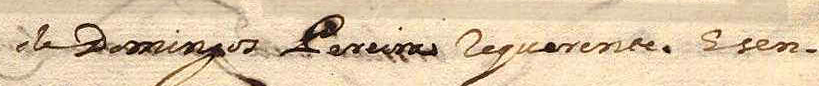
de Domingos Pereira requerente. E sen
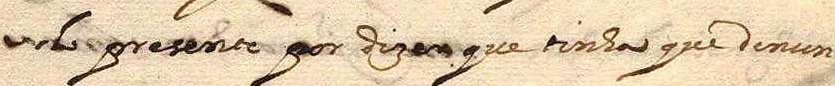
do presente por dizer que tinha que denun
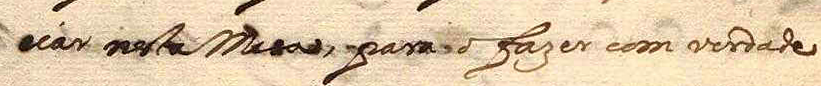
ciar nesta mesa, para o fazer com verdade
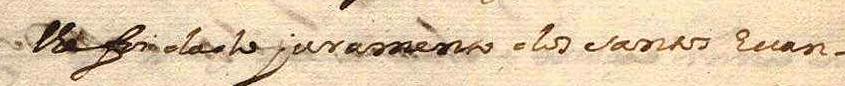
lhe foi dado juramento dos santos Euan
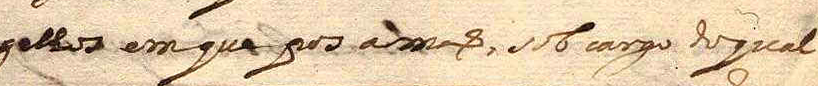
gelhos em que pos a maõ, sob cargo do qual
